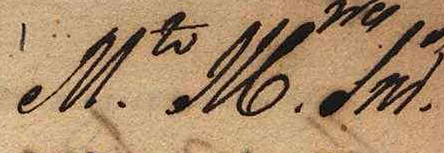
M.to Ill.res. Snr.s
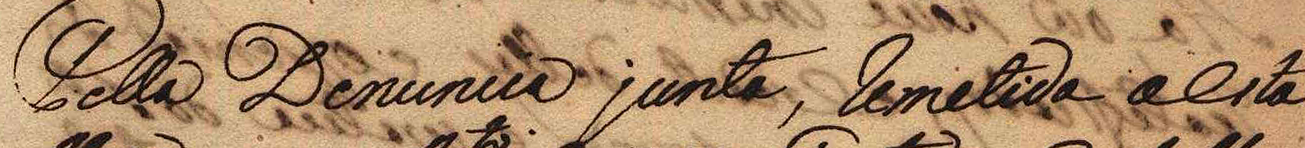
Pella Denuncia junta, Remetida a esta
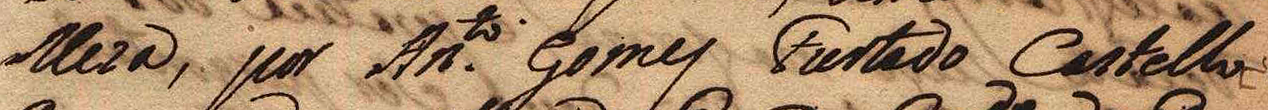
Meza, por An.to Gomes Furtado Castello
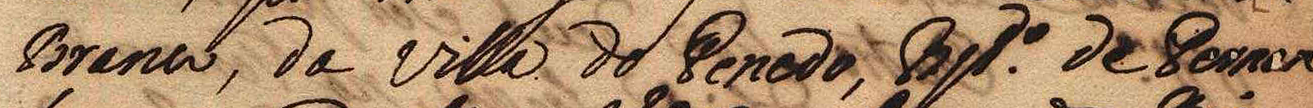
Branco, da Villa do Penedo, Bp.do de Pernan
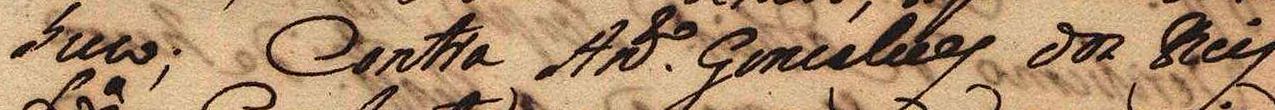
buco; Contra An.to Goncalues doz Reis
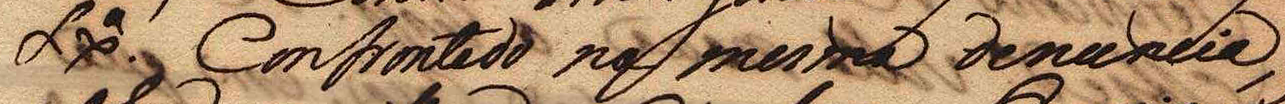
Lxa. Confrontado na mesma denuncia,
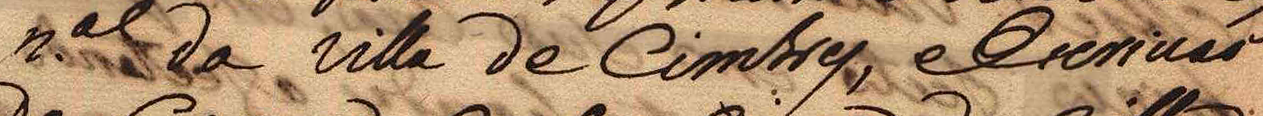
n.al da villa de Cimbres, e Escriuaõ
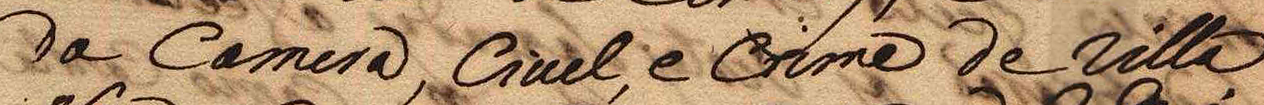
da Camera, Ciuel, e Crime de villa
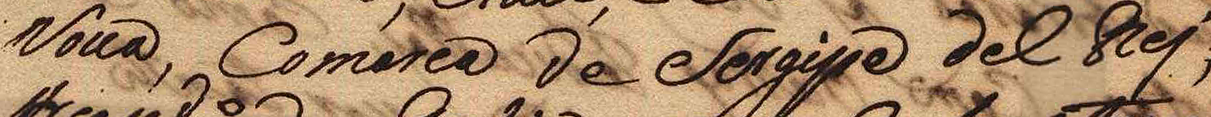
Noua, Comarca de Sergipe del Rej,
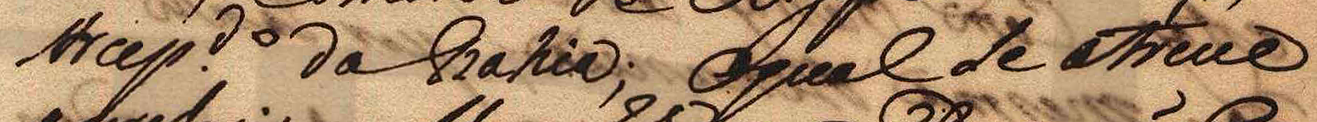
Arcep.do da Bahia; O qual se atreue
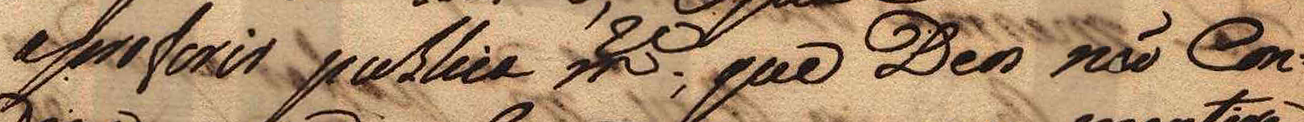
a proferir publicamte; que Deos naõ Con
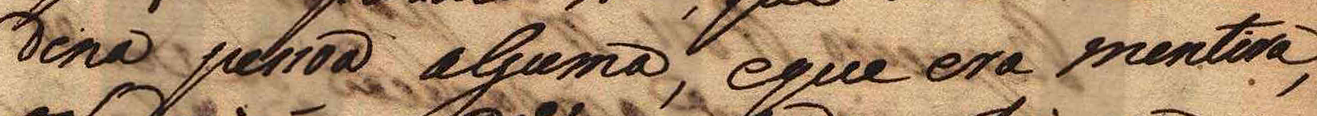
dena pessoa alguma, e que era mentira,
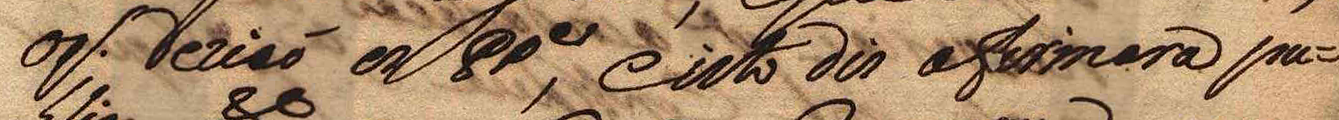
o q̄ deziaõ os PPes, e isto dis afirmara pu
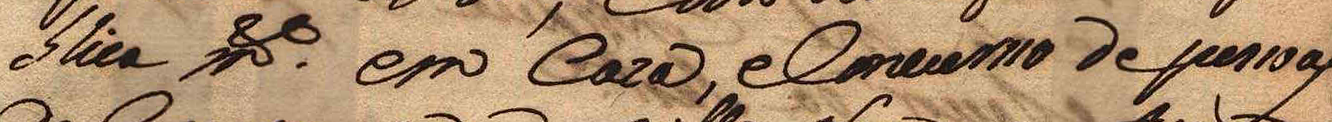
blicamte. em Caza, e Concursso de pessoas
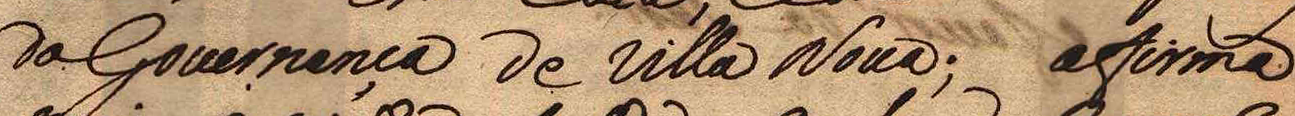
da Gouernança de villa Noua; afirma
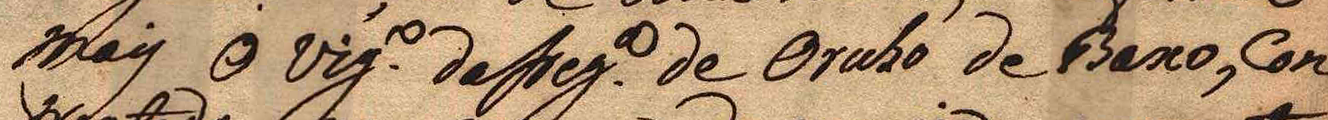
mais O vig.o de freg.a de Orubo de Baxo, Con
